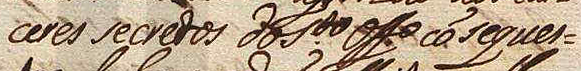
ceres secretos do s.to Off.o cō seques
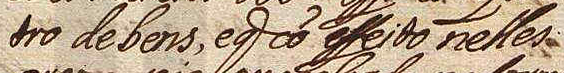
tro de bens, e q̄ cō effeito nelles
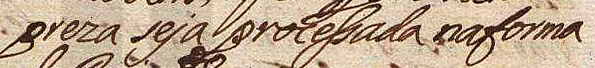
preza seja processada na forma
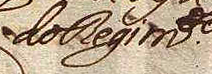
do Regimto.
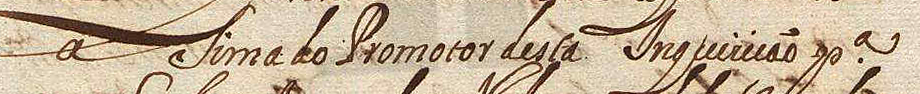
aSima do Promotor desta Inquiziçaõ p.a
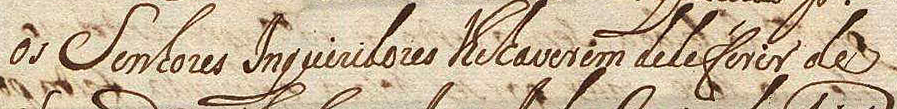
os Senhores Inquizidores lhe haverem de deferir de
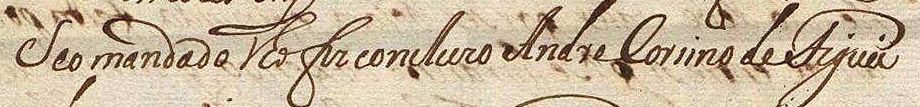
Seo mandado lho fiz concluzo Andre Corsino de Figuei
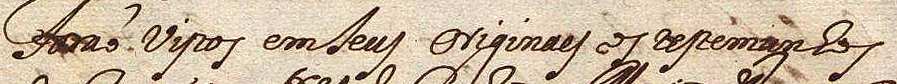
Foraõ vistos em Seus originaes os testemunhos
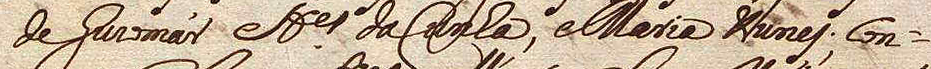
de Guiomár H.es da Cunha, e Maria Nunes; Con
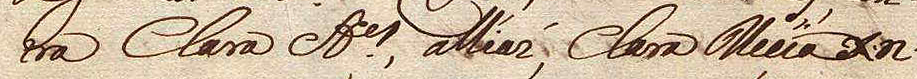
tra Clara H.es, alliaz, Clara Meçia x. n.
